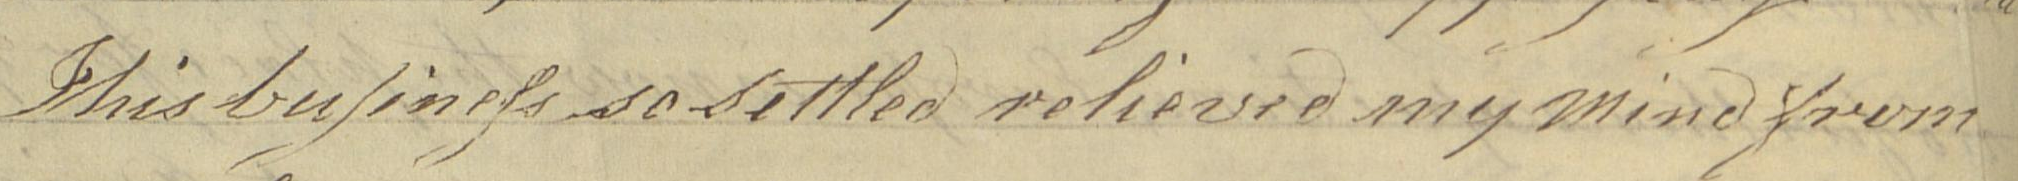This business so settled relieved my mind from
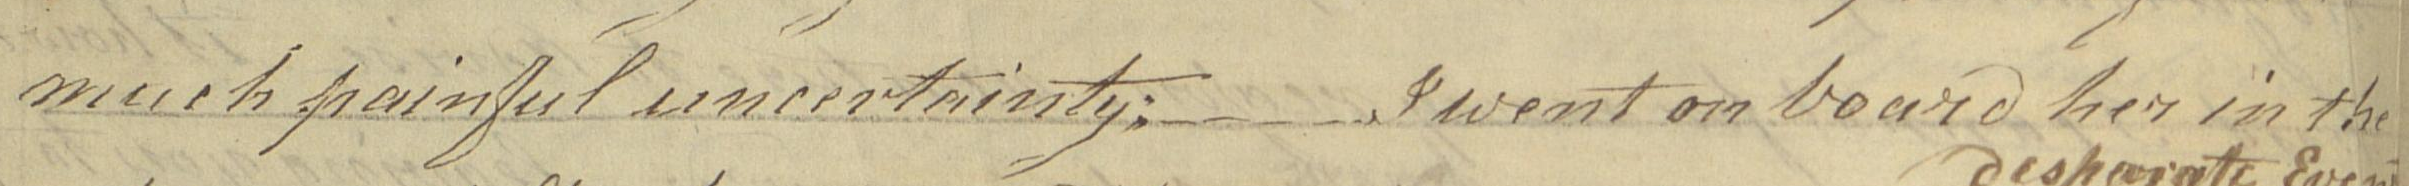much painful uncertainty; I went on board her in the
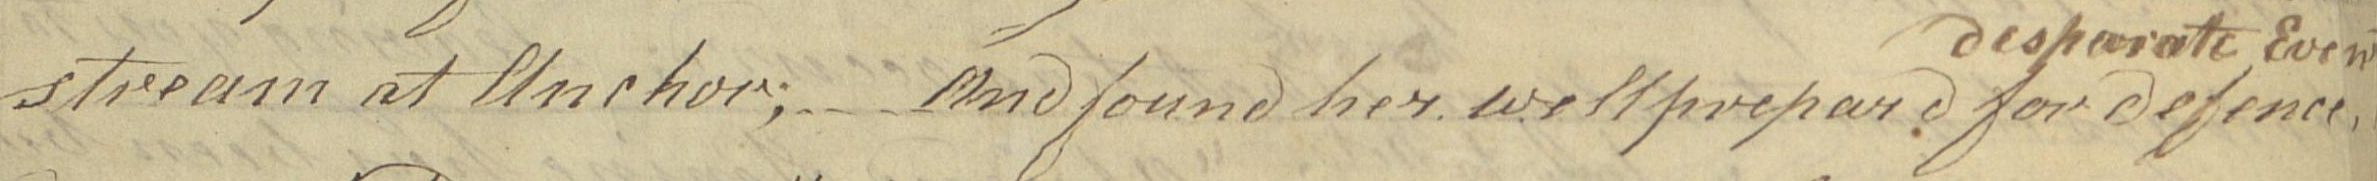stream at Anchor; And found her well prepard for defence
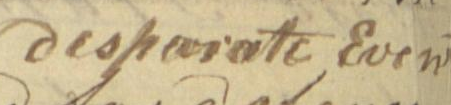desparate Even;
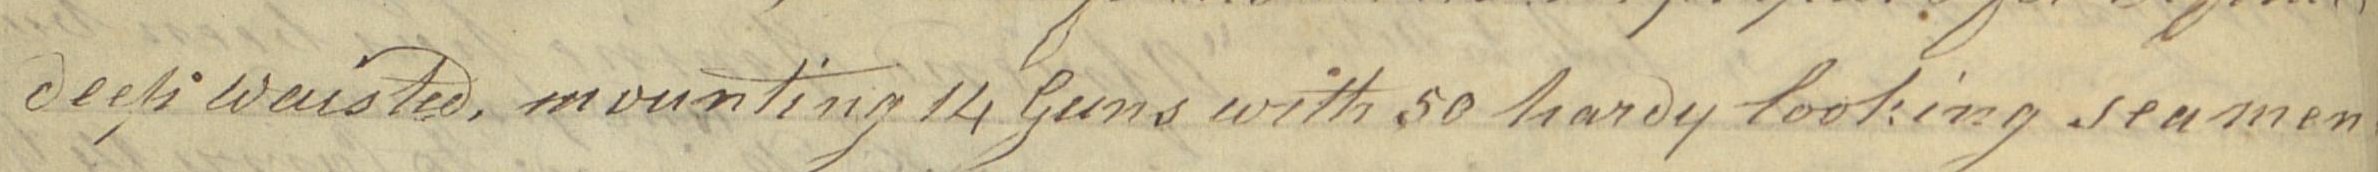deep waisted, mounting 14 Guns with so hardy looking seamen
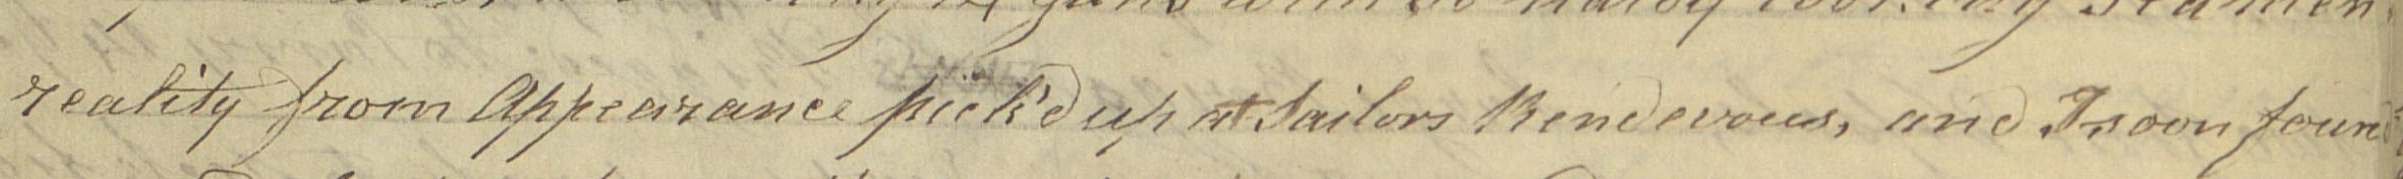reality from appearance pick'd up at Sailors Rendoeous, and I soon foun-
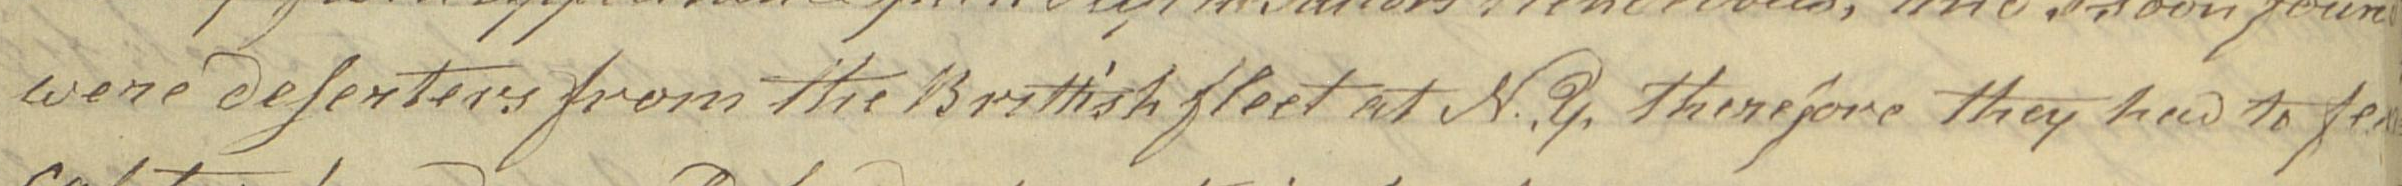were deserters from the Brittish fleet at N. Y. therefore they had to se-
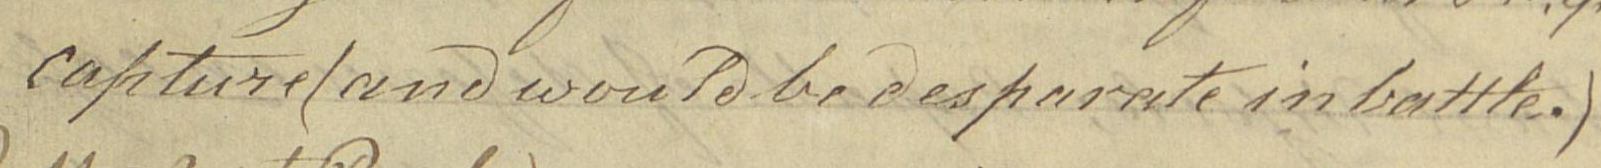capture (and would be desparnte in battle.)
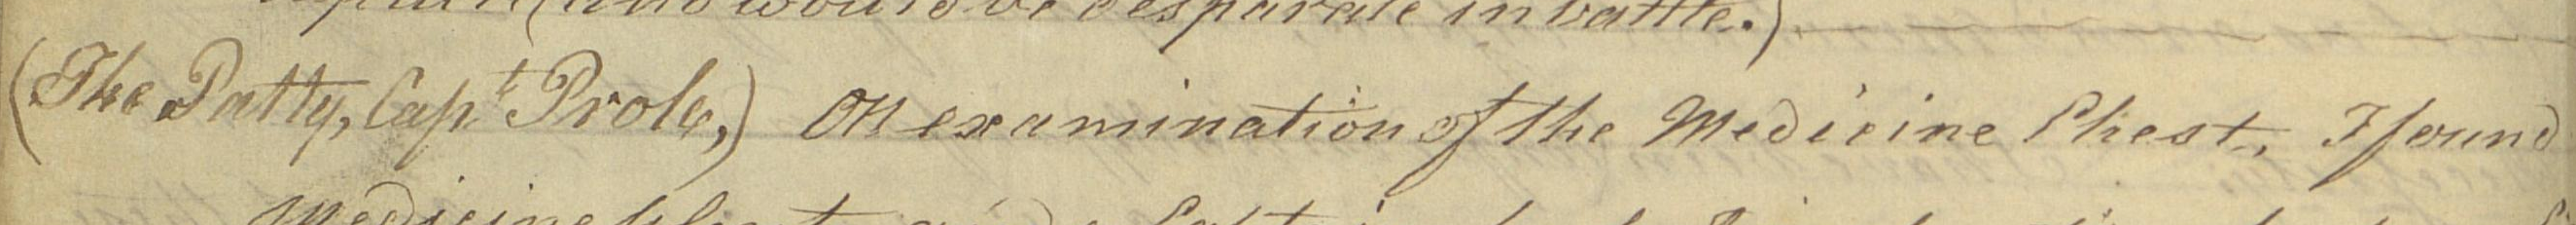(The Patty, Cap^t. Prole,) On examination of the Medicine Chest, I found
